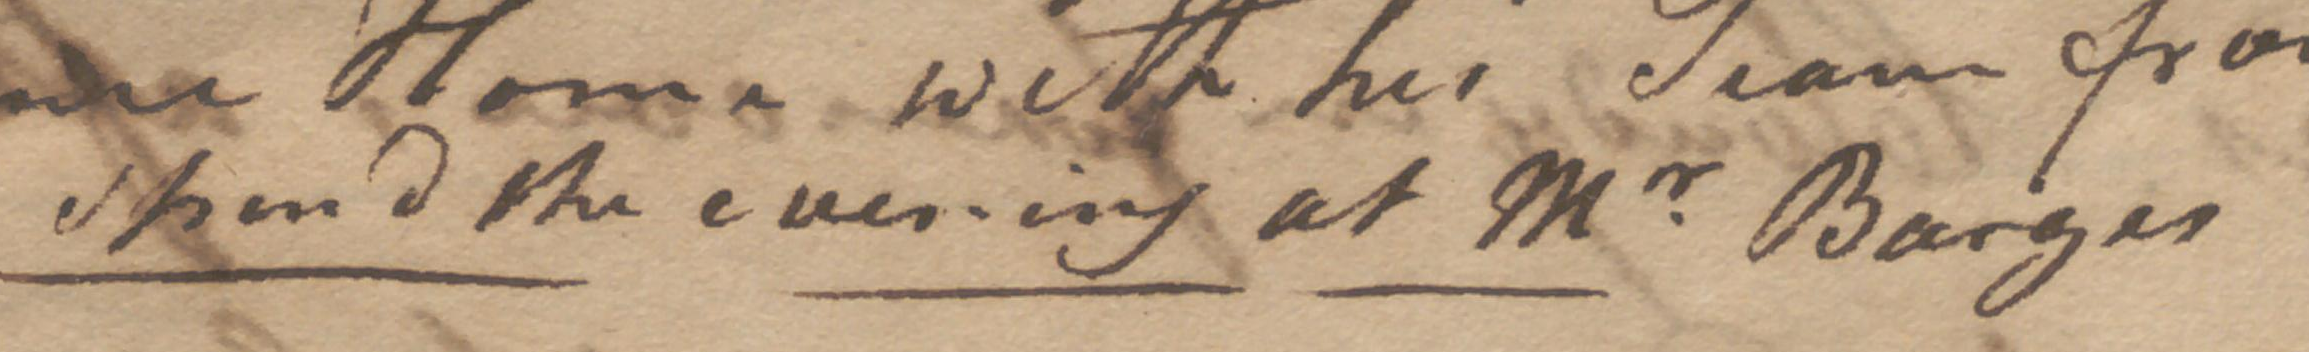spin'd the evening at M^r. Barges
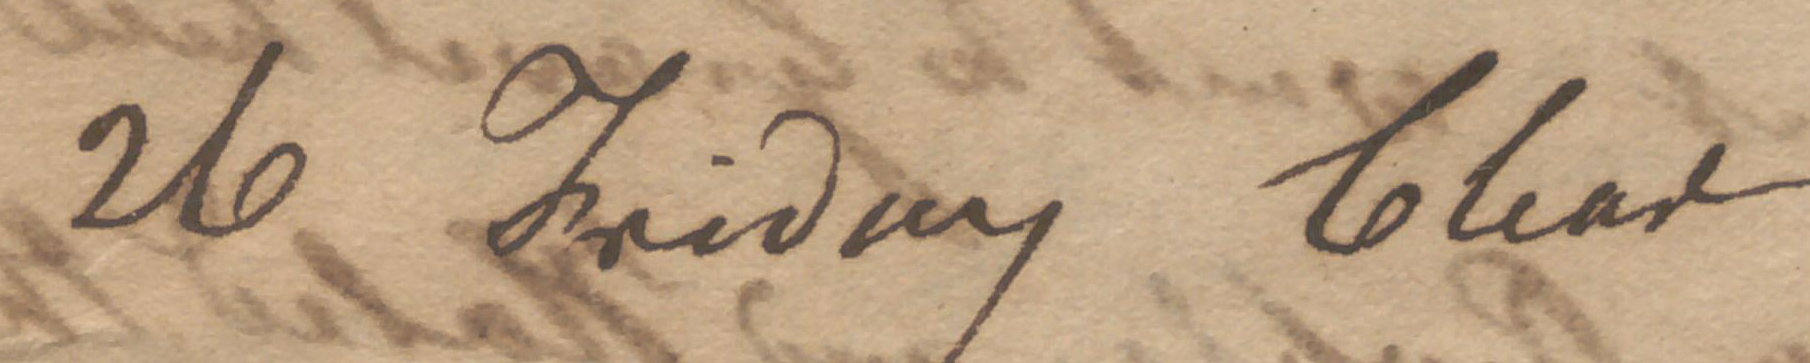26 Friday Clear
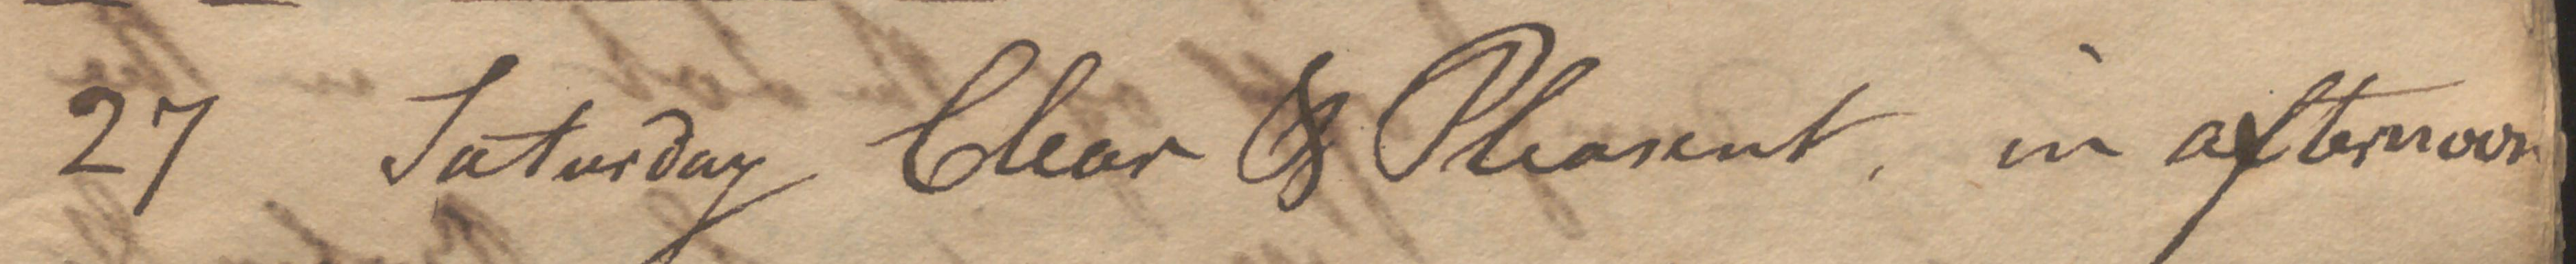27 Saturday Clear & Pleasent, in afternoon
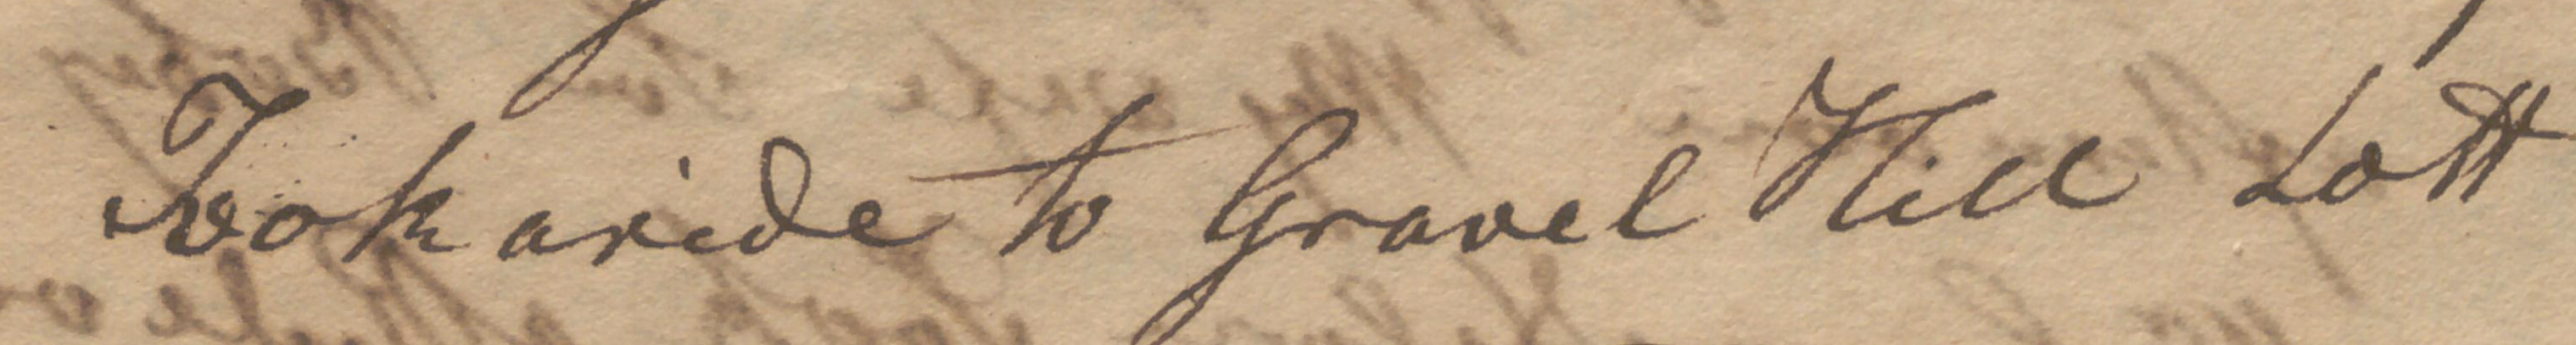Took a ride to Gravel Hill Lott
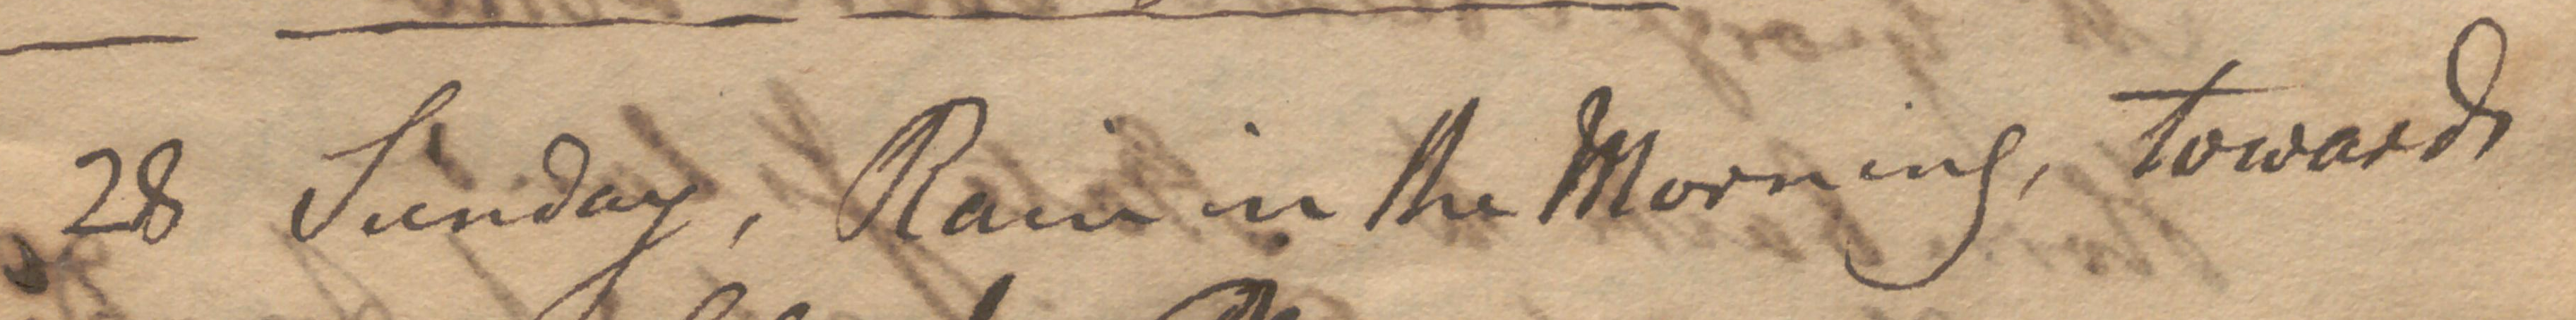28 Sunday, Rain in the Morning towards
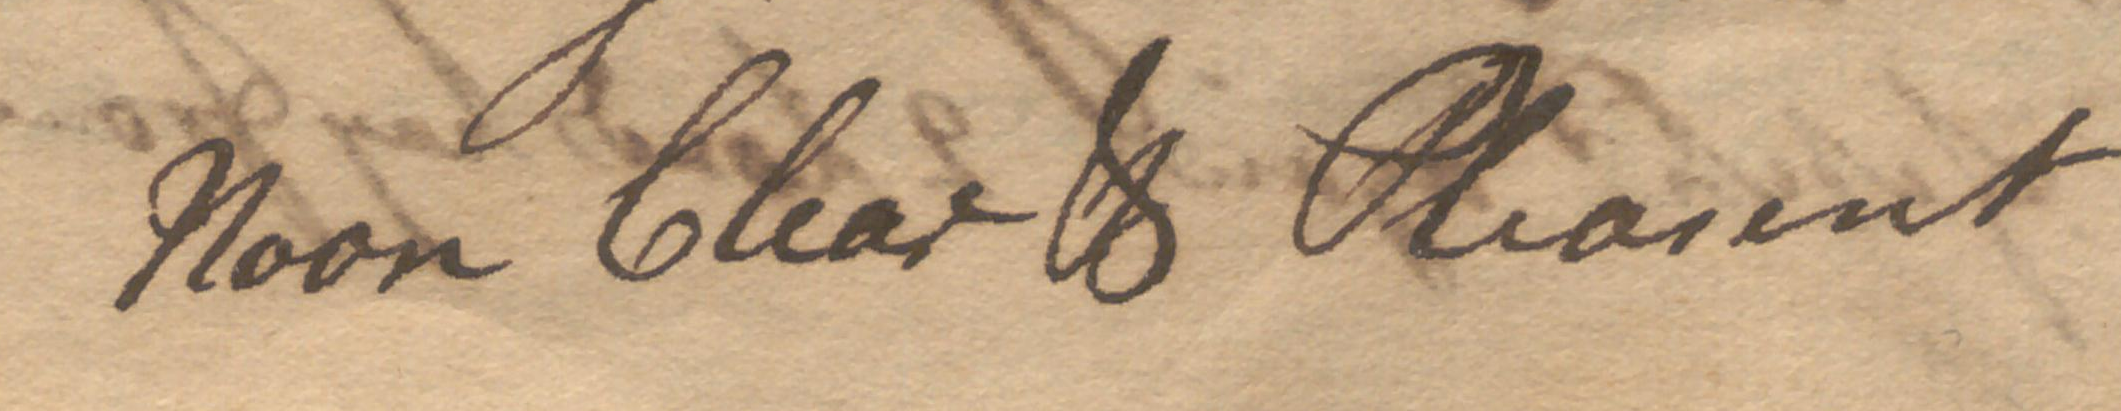Noon Clear & Pleasent
